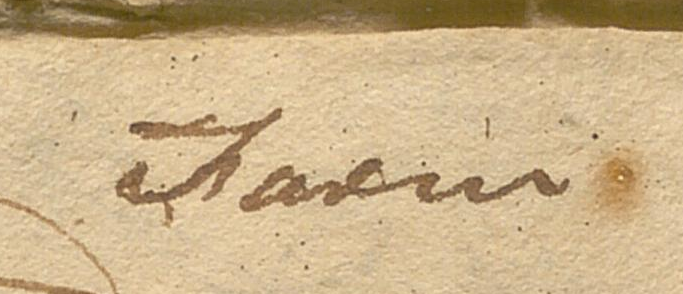Farm
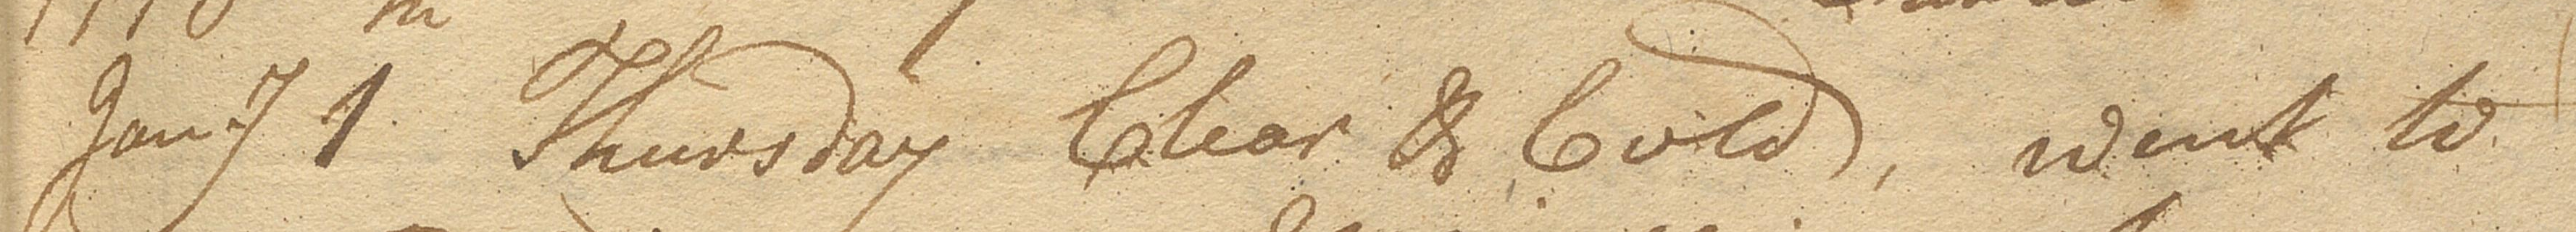Jan^y 1^th Thursday Clear & Cold, went to
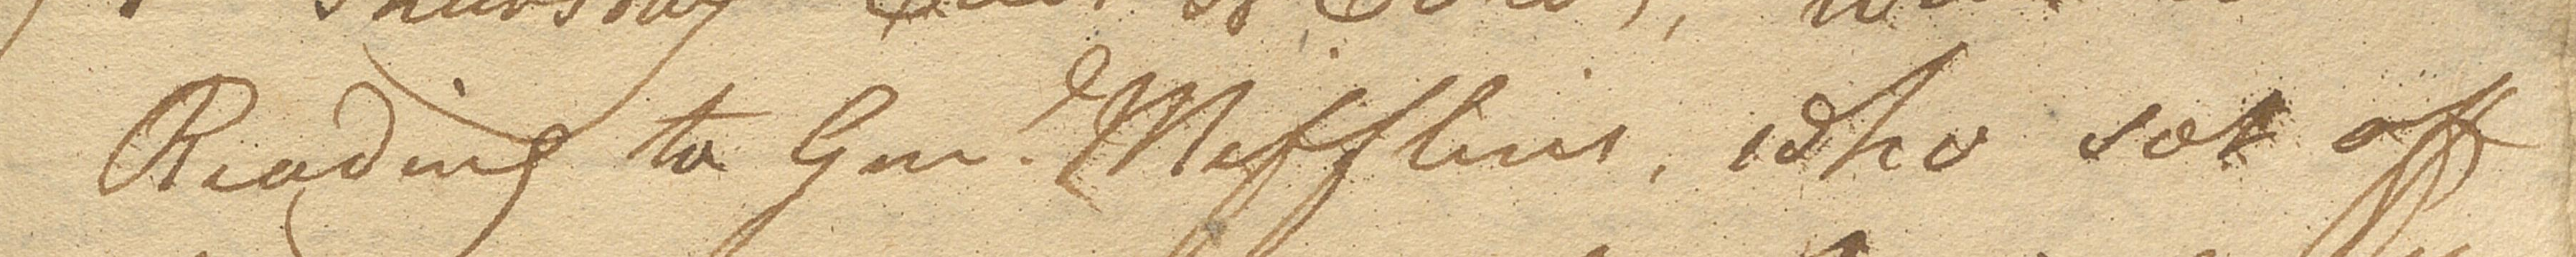Reading to Gen^l. Mifflins, who set off
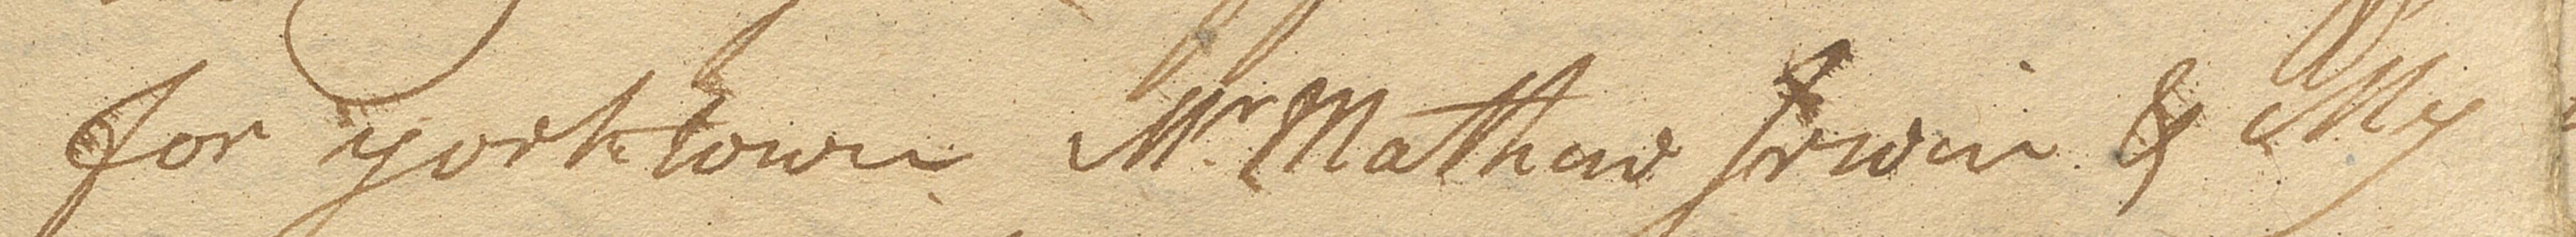for yorktown M^r. Mathew Irwin & My to
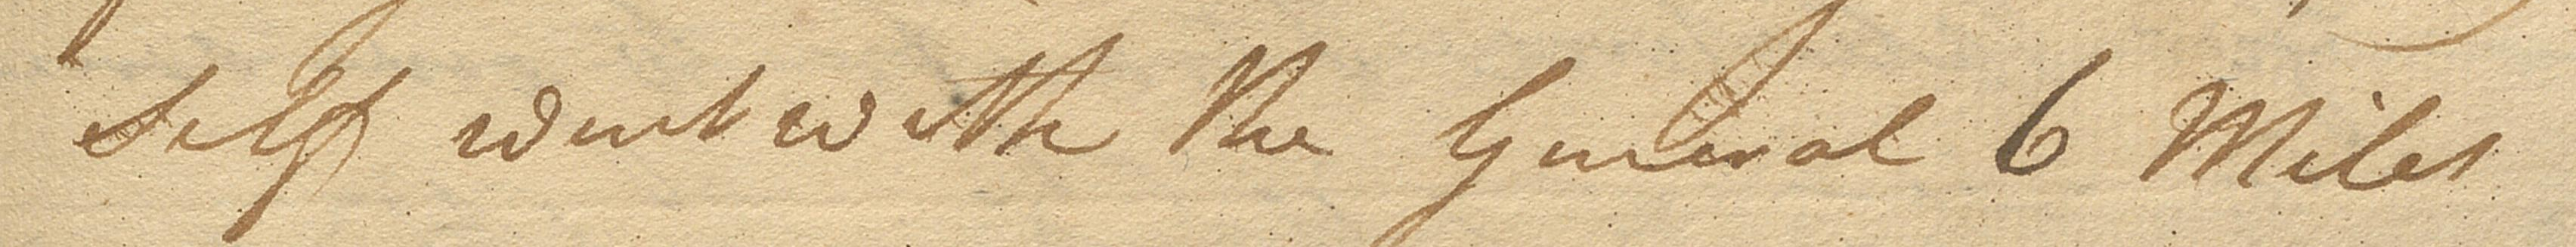self went with the General 6 Miles
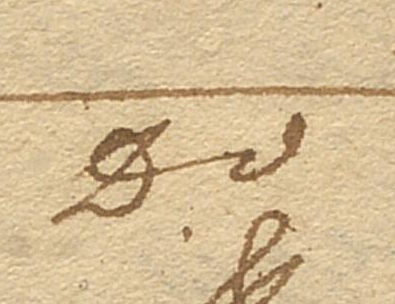D^o
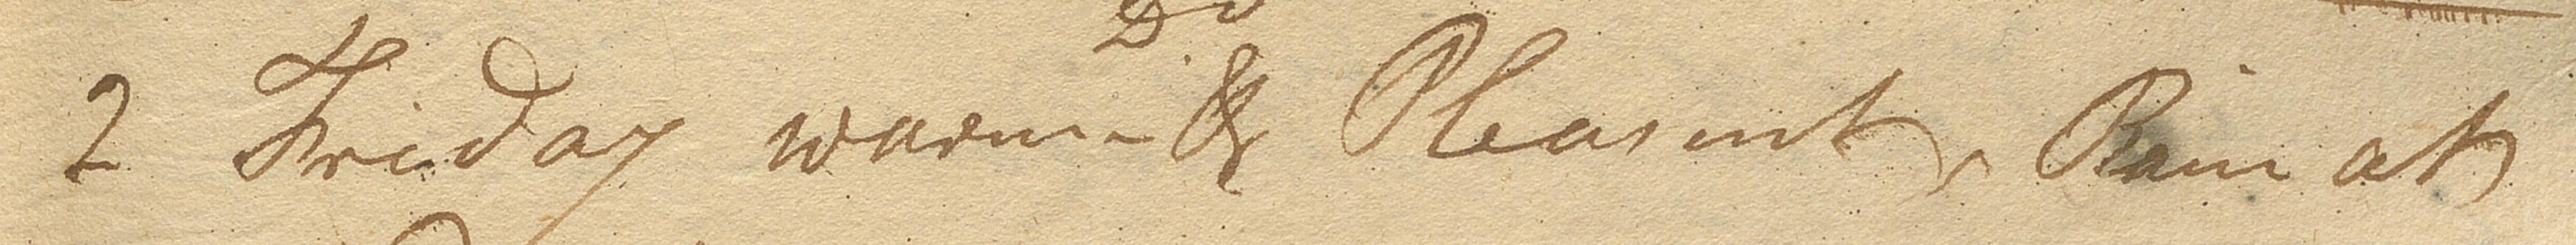2 Friday warm- & Pleasent, Rain at
